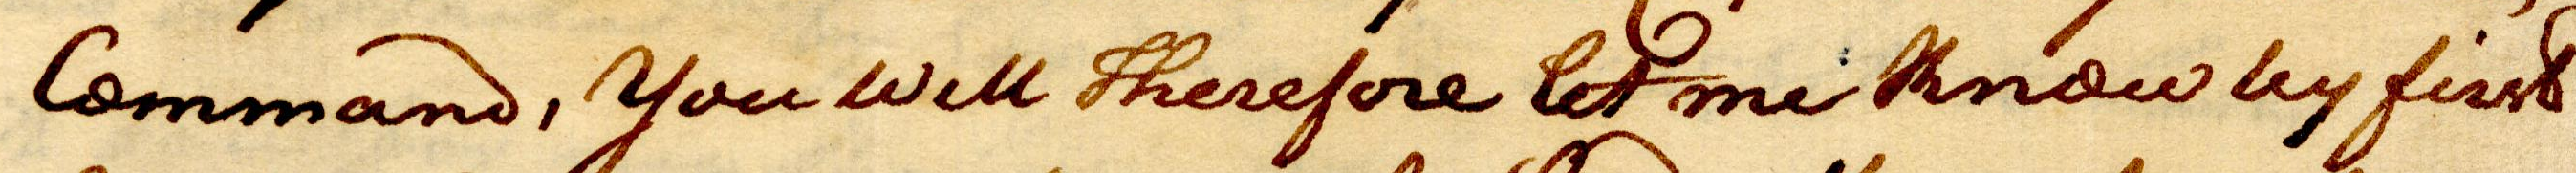Command, you will therefore let me Know by first
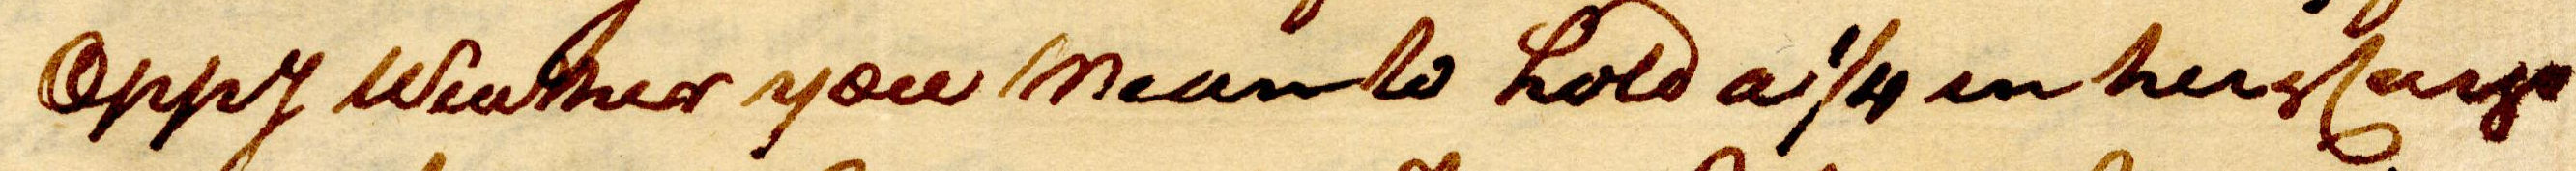opp^y Weather you mean to hold a 1/4 in hers Cargo
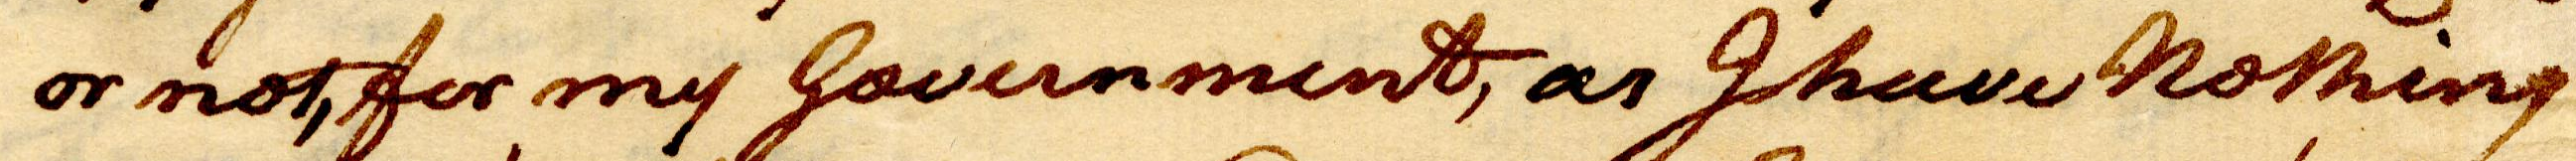or not, for my Government, as I have nothing
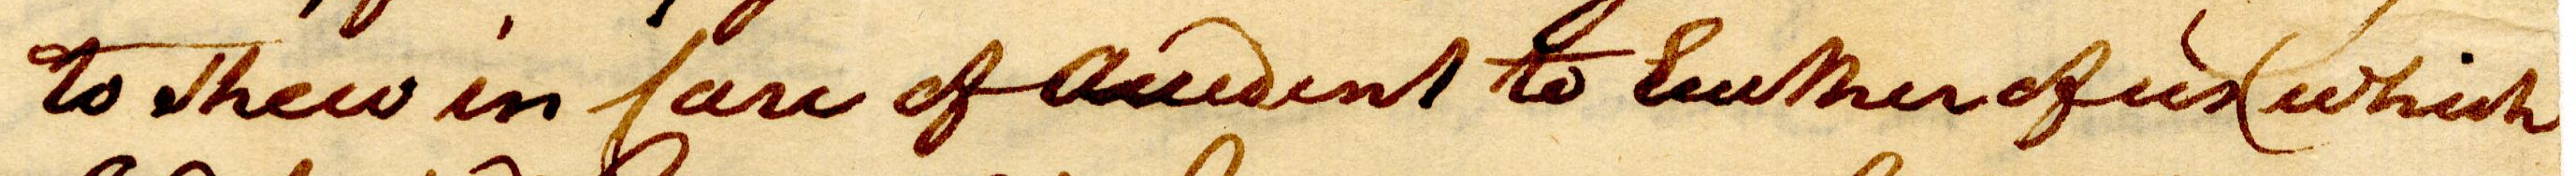to shew in Care of accident to Either of as (which
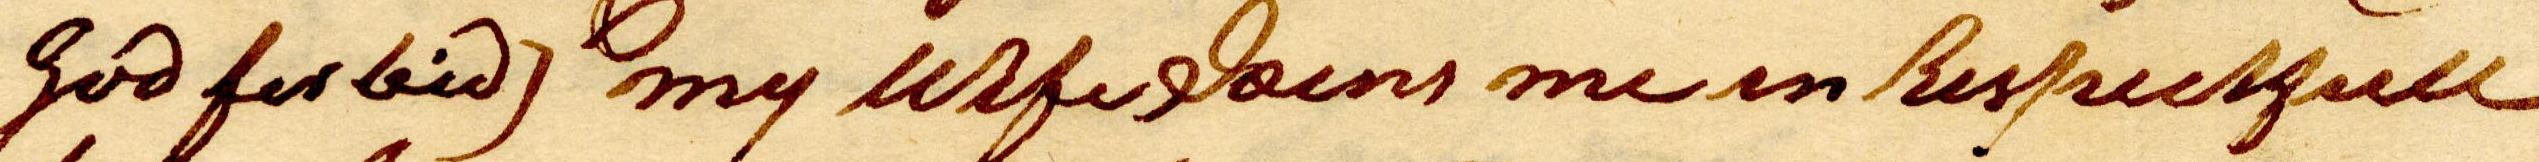God forbid) my wife Joins me in Respectfull
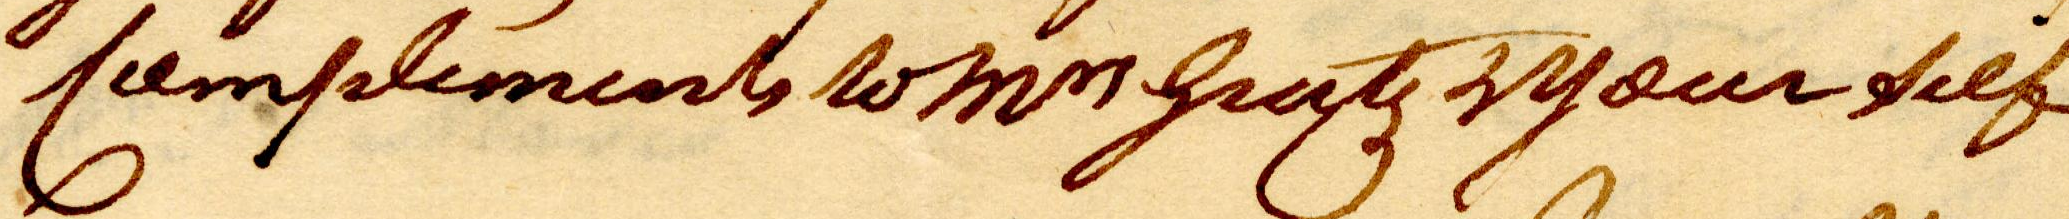complements to M^rs Gratz & yourself
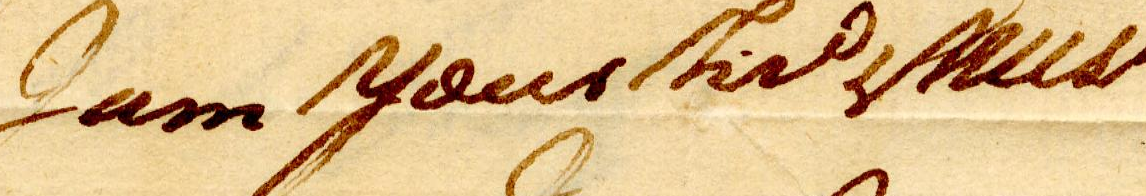I am your hu^l Servent
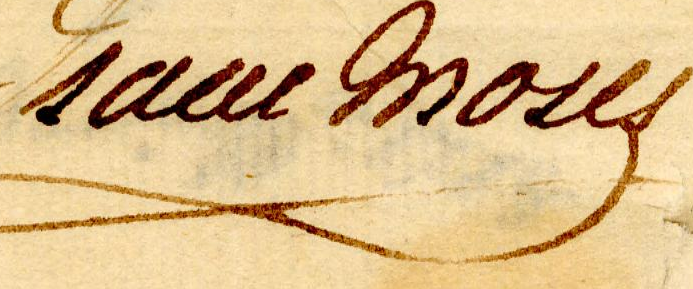Isaac Moses
